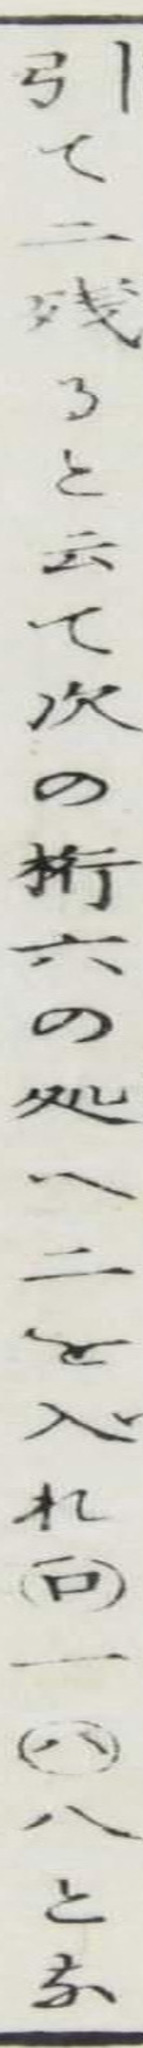引て二残ると云て次の桁六の処へ二を入れ㋺一㋩八とな
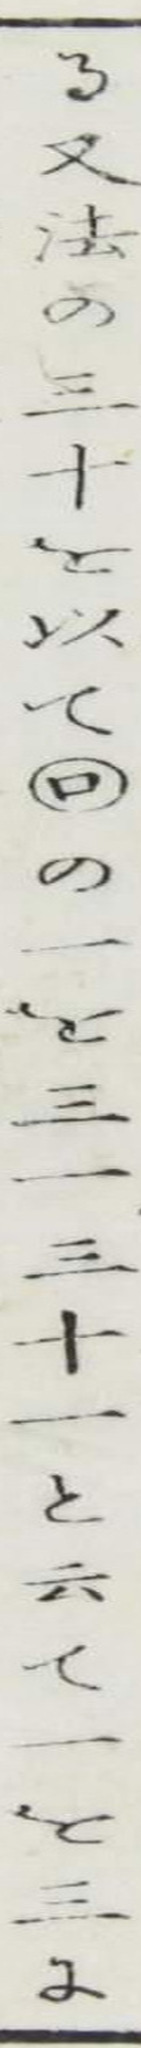る又法の三十を以て㋺の一を三一．三十一と云て一を三に
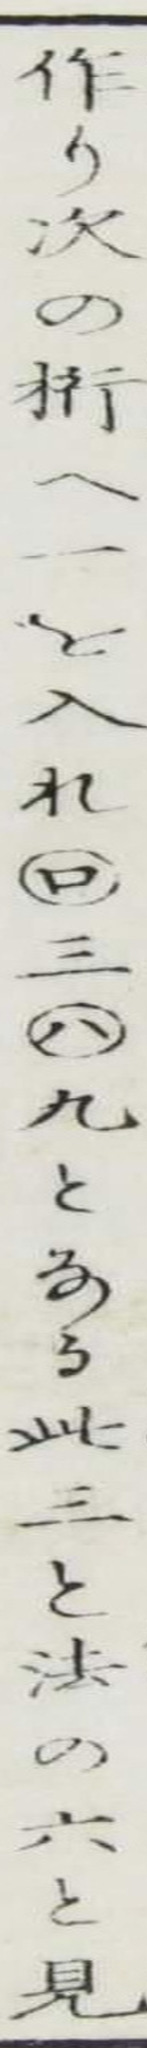作り次の桁へ一を入れ㋺三㋩九となる此三と法の六と見
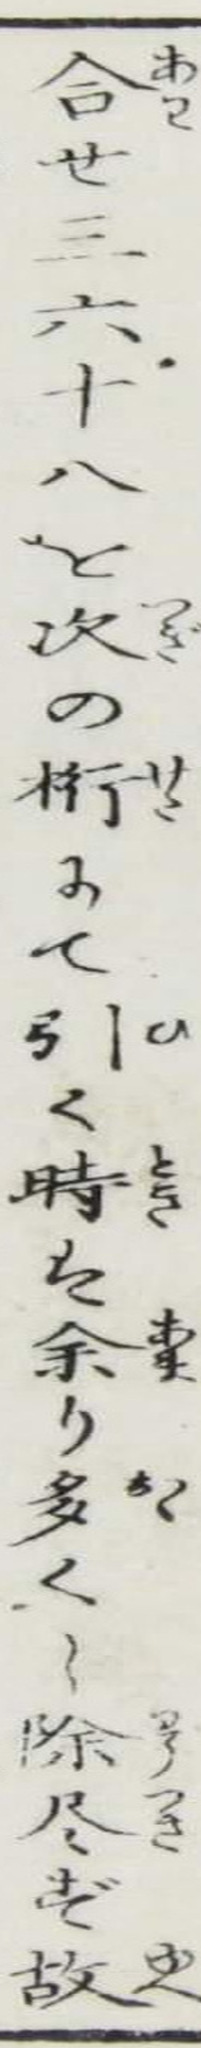合せ三六．十八を次の桁にて引く時は余り多くし除尽ず故
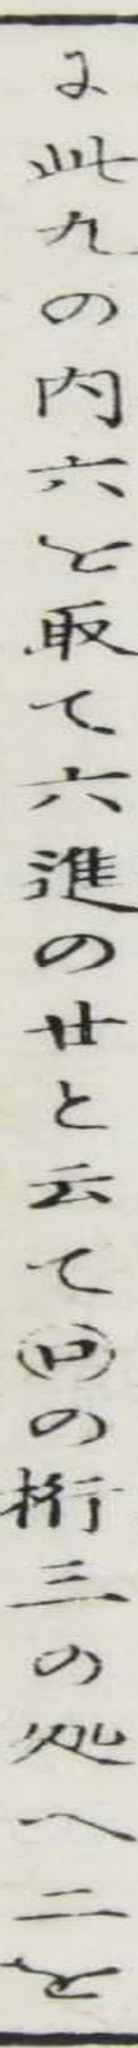に此九の内六を取て六進の廿と云て㋺の桁三の処へ二を
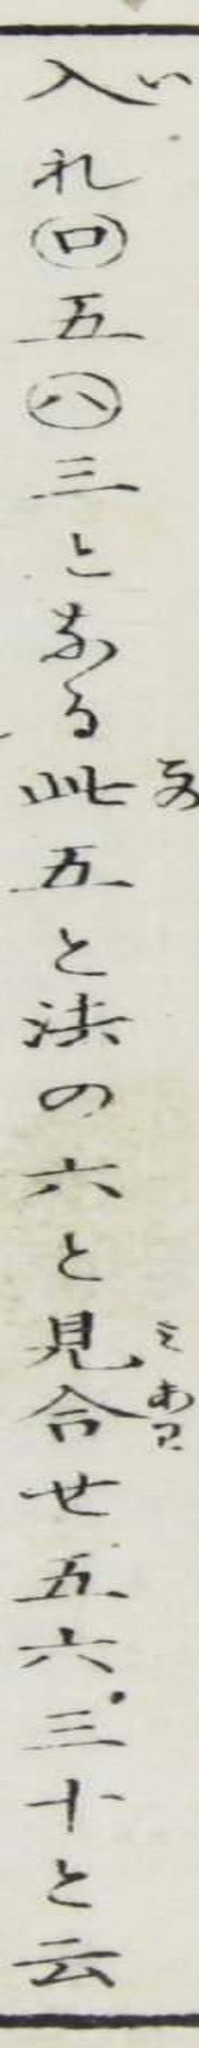入れ㋺五㋩三となる此五と法の六と見合せ五六．三十と云
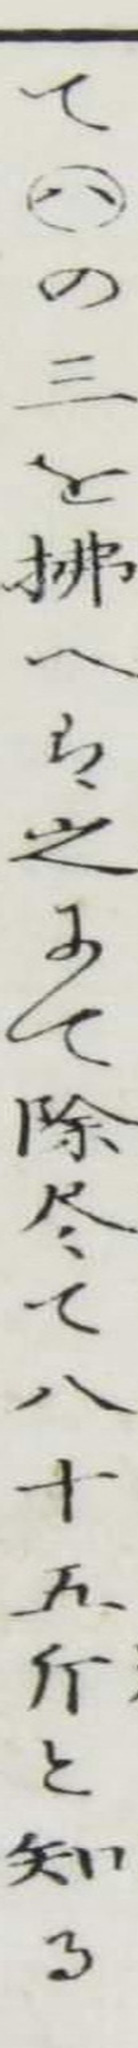て㋩の三を払へは之にて除尽て八十五斤と知る
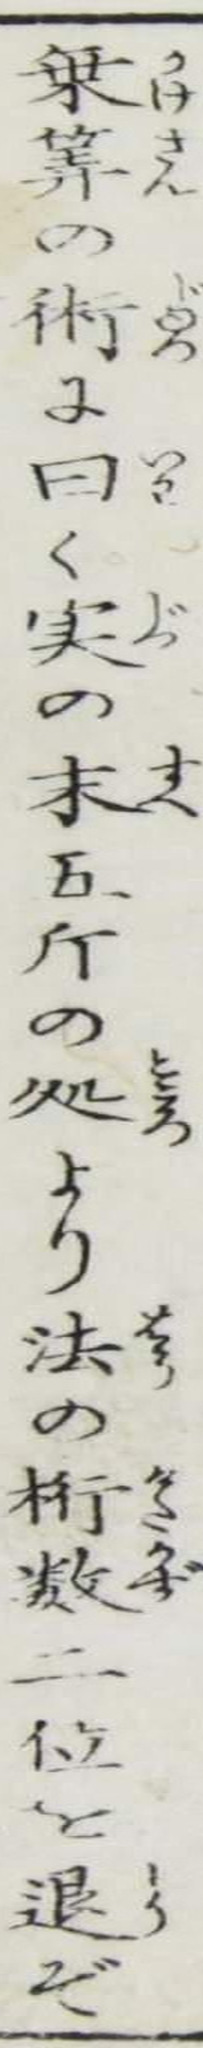乗算の術に曰く実の末五斤の処より法の桁数二位を退ぞ
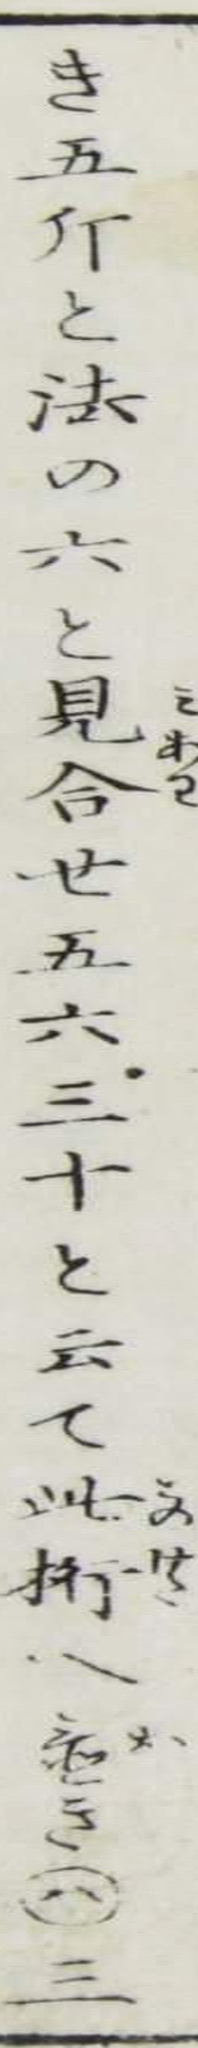き五斤と法の六と見合せ五六．三十と云て此桁へ置き㋩三
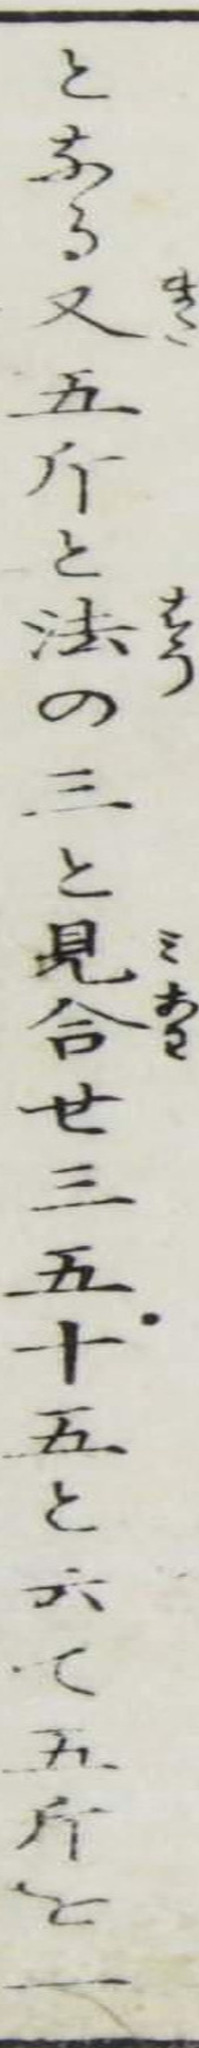となる又五斤と法の三と見合せ三五．十五と云て五斤を一
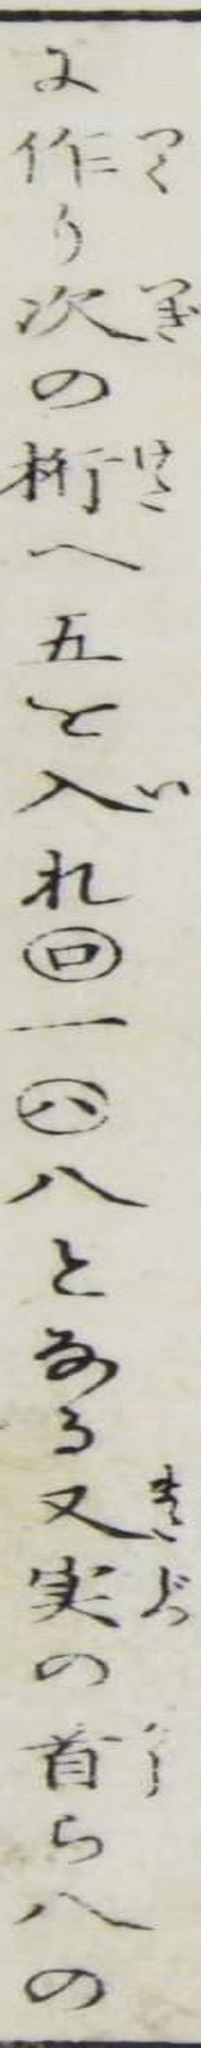に作り次の桁へ五を入れ㋺一㋩八となる又実の首ら八の

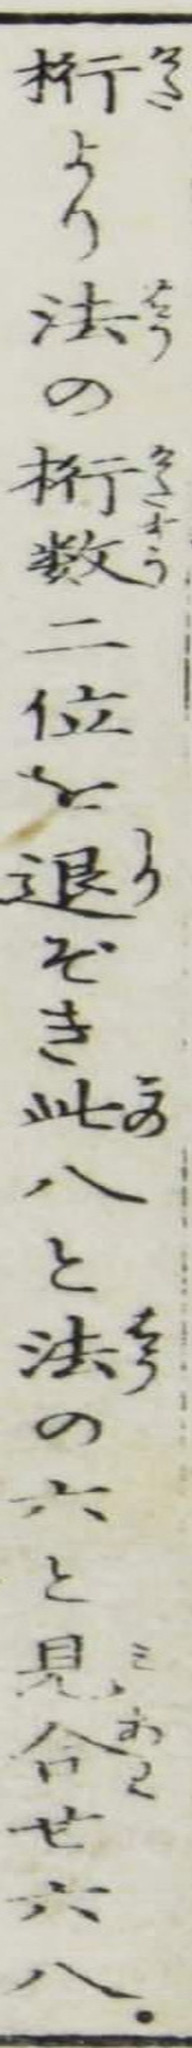桁より法の桁数二位を退ぞき此八と法の六と見合せ六八．
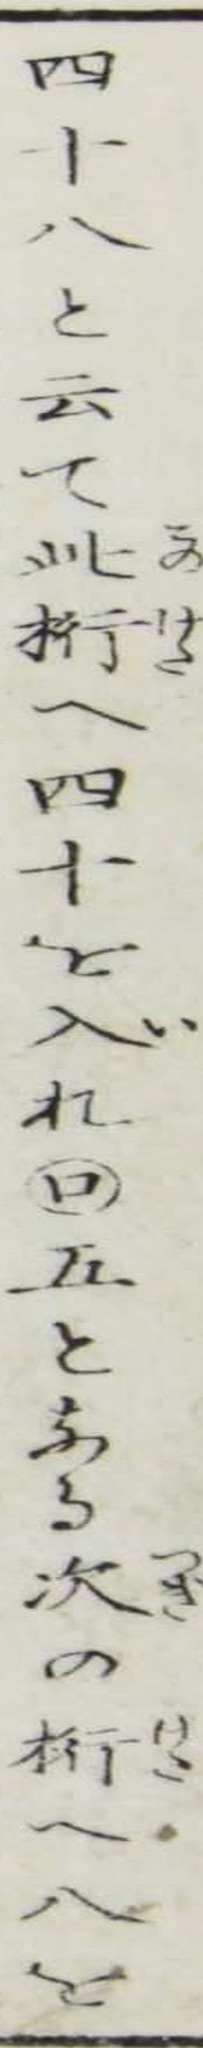四十八と云て此桁へ四十を入れ㋺五となる次の桁へ八を
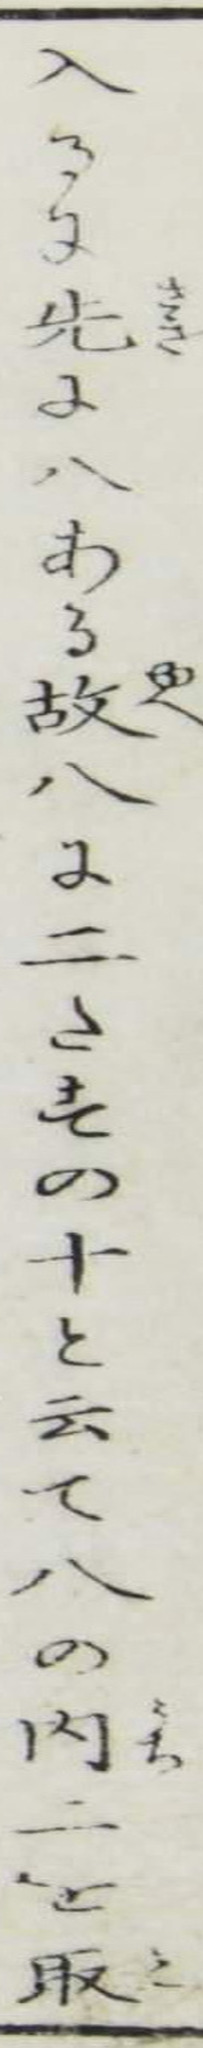入るに先に八ある故八に二たすの十と云て八の内二を取
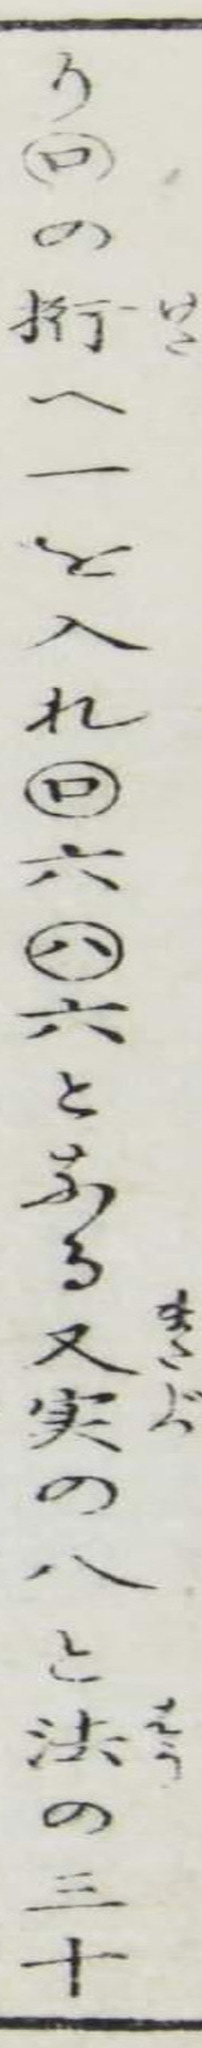り㋺の桁へ一を入れ㋺六㋩六となる又実の八と法の三十
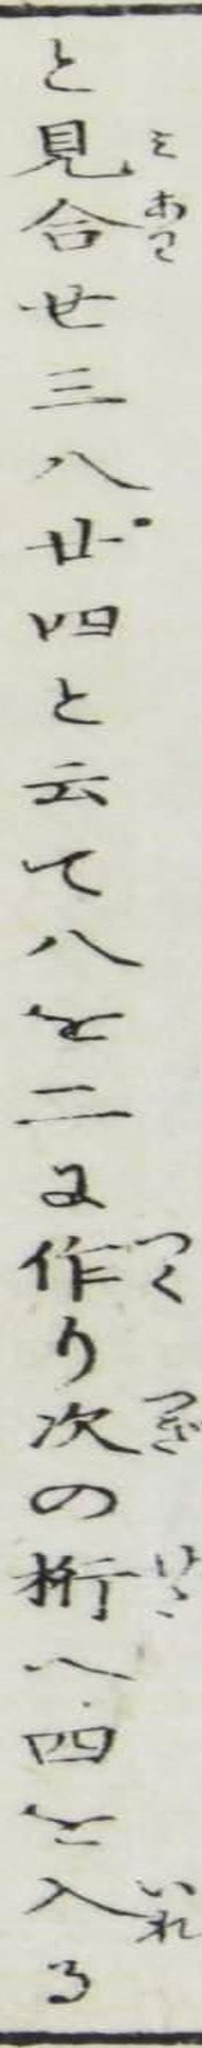と見合せ三八．廿四と云て八を二に作り次の桁へ四を入る
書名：明治小學塵劫記 卷1
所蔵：東京学芸大学教育コンテンツアーカイブ
